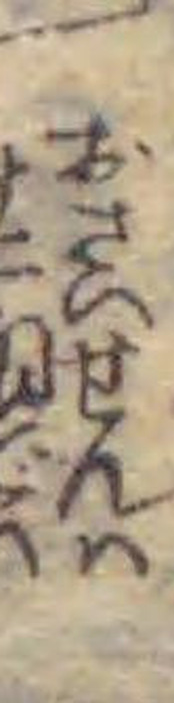おさいせんは
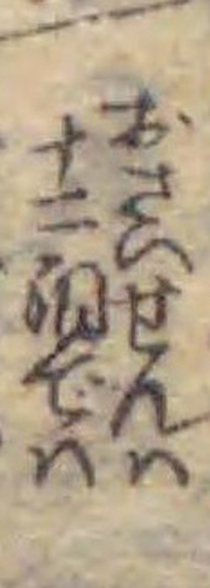十二銅では
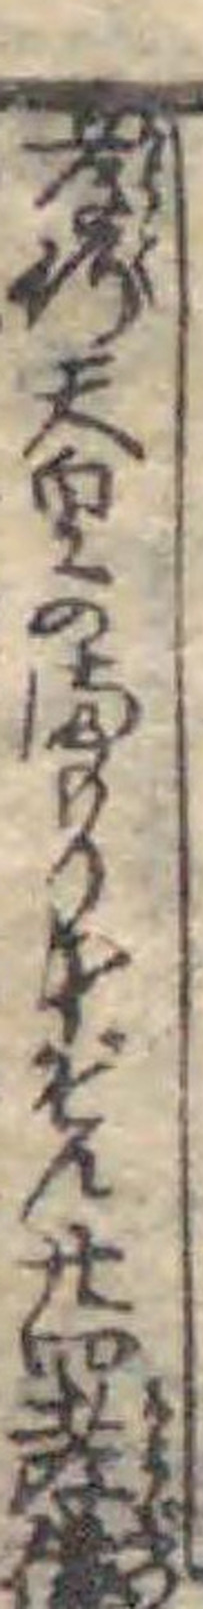孝行天皇のまもり本ぞん廿四孝仏
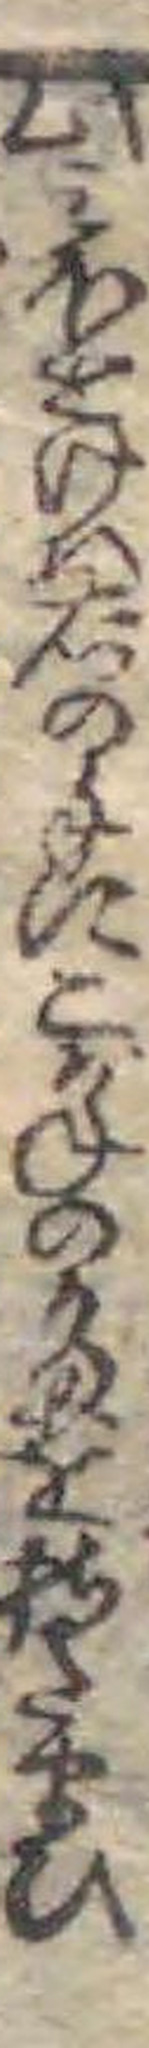此みほとけは右の手にこかねのかまを持たまひ
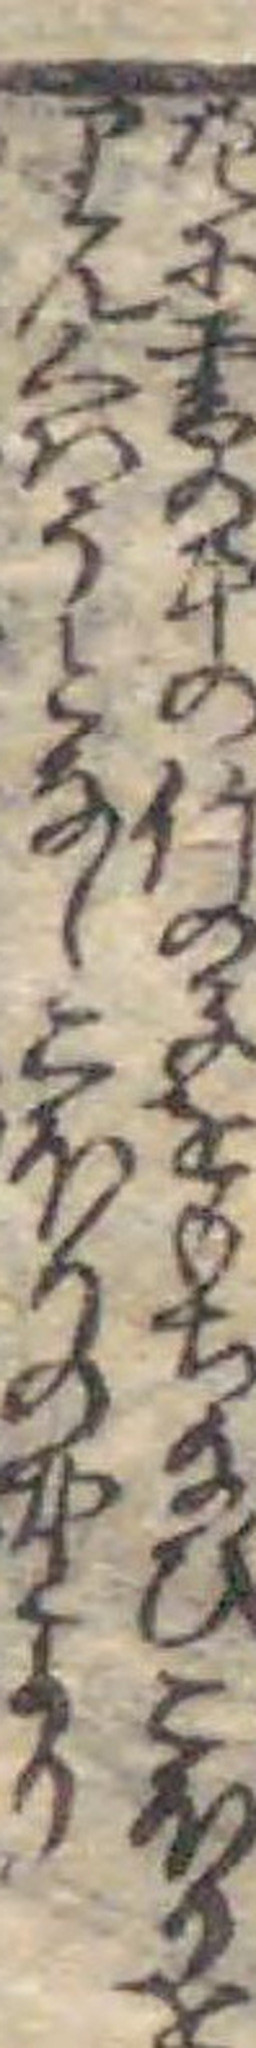りんくはうとなしこほりの中より
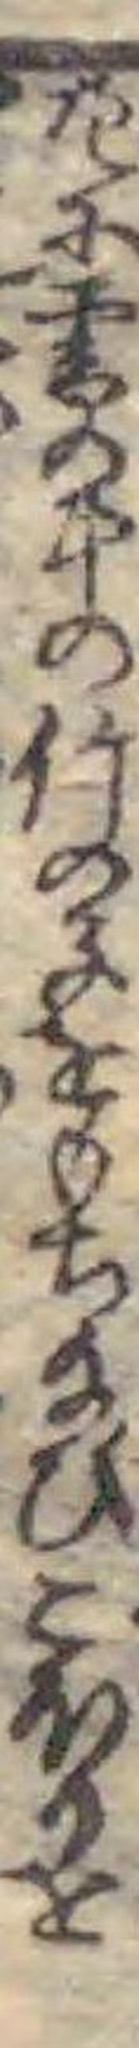左に雪の中の竹の子をもち給ひこほりを
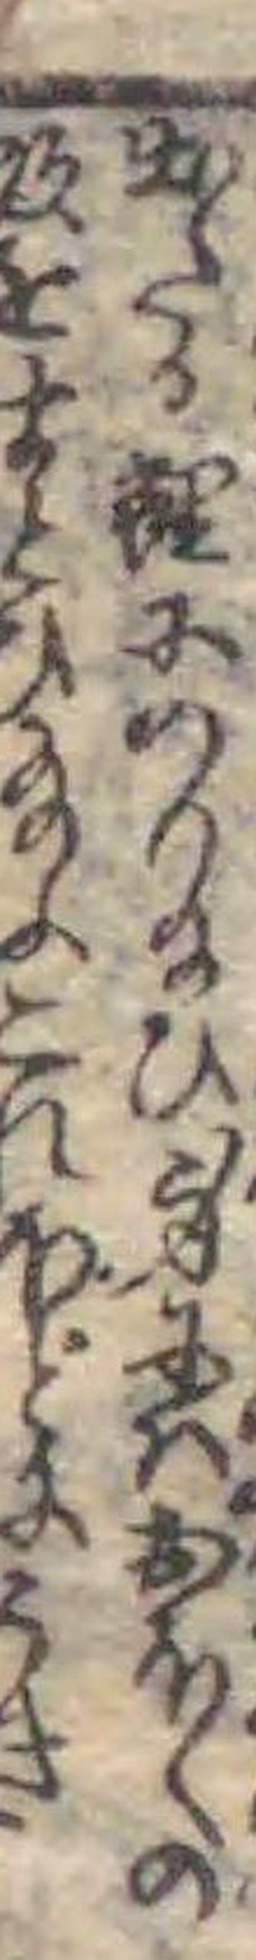蚊をまとひ給ふこれほどにうき
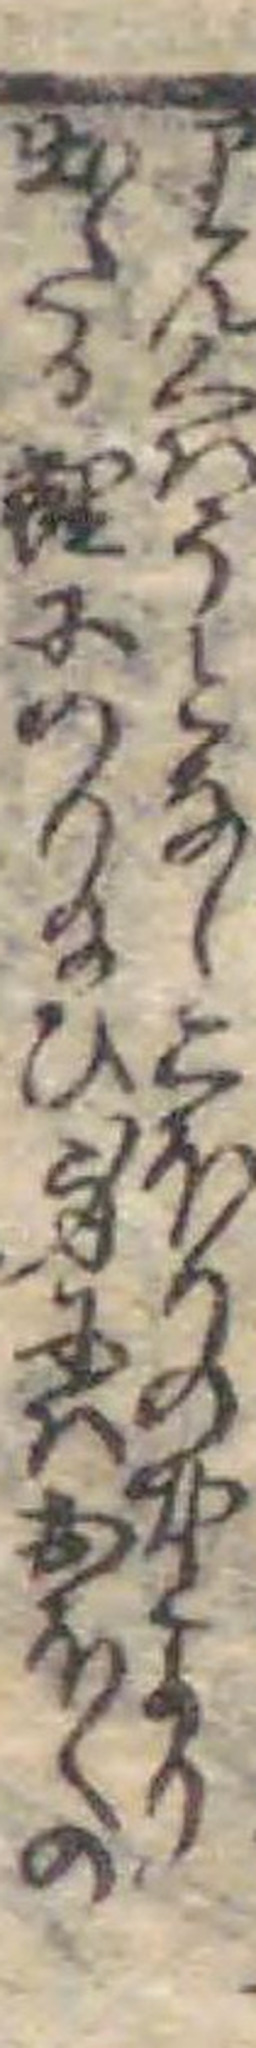出たる鯉にのり給ひ身にはおほくの
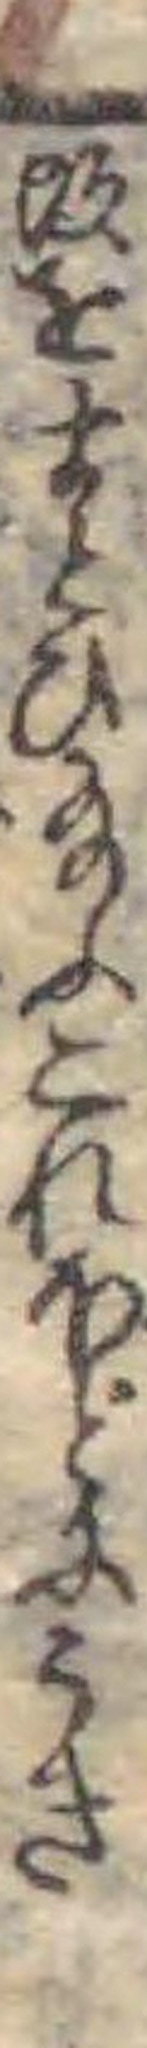蚊をまとひ給ふこれほどにうき
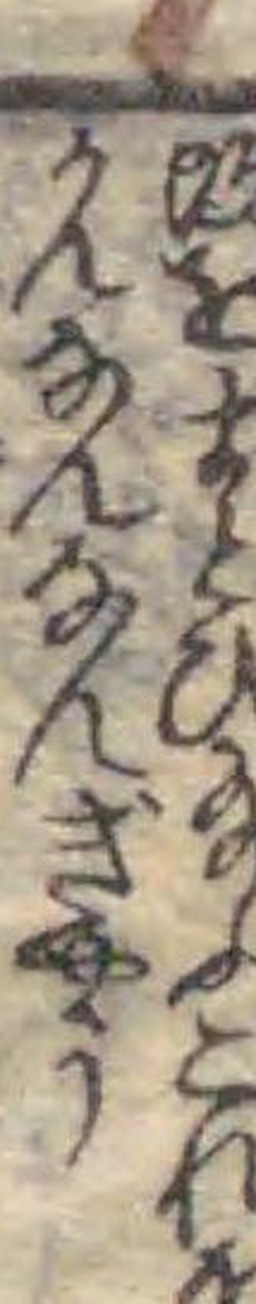かんなんなんぎやう
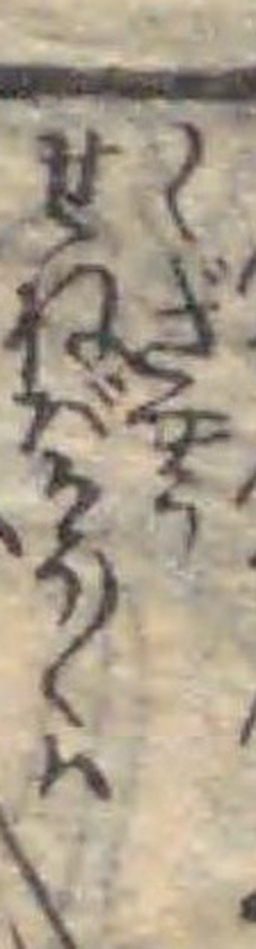せねばかう〳〵は
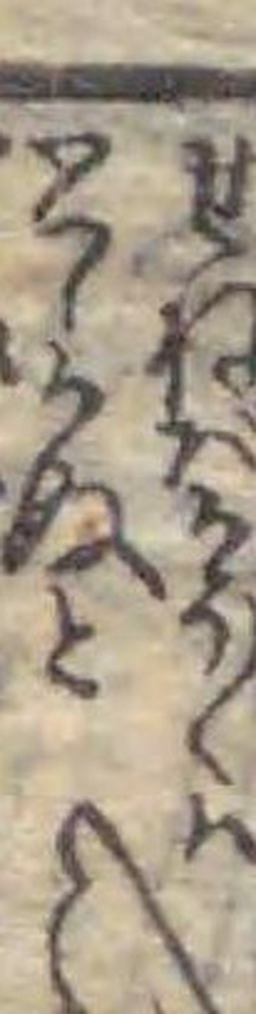とゝかぬと
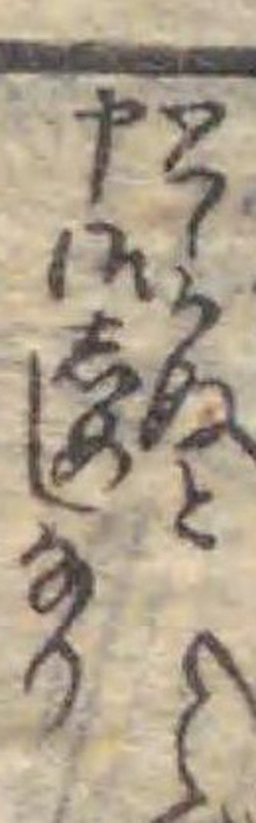申御しめしなり
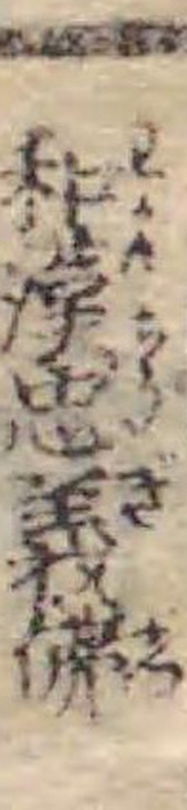和漢忠義仏
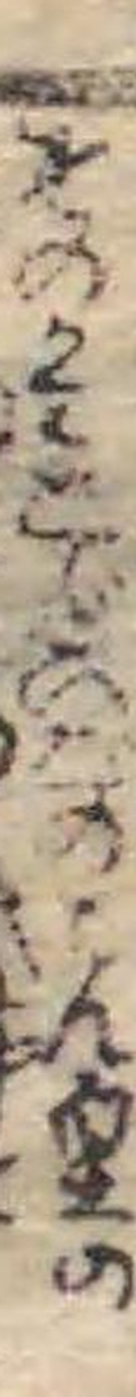そのかみごだいごのてん皇の
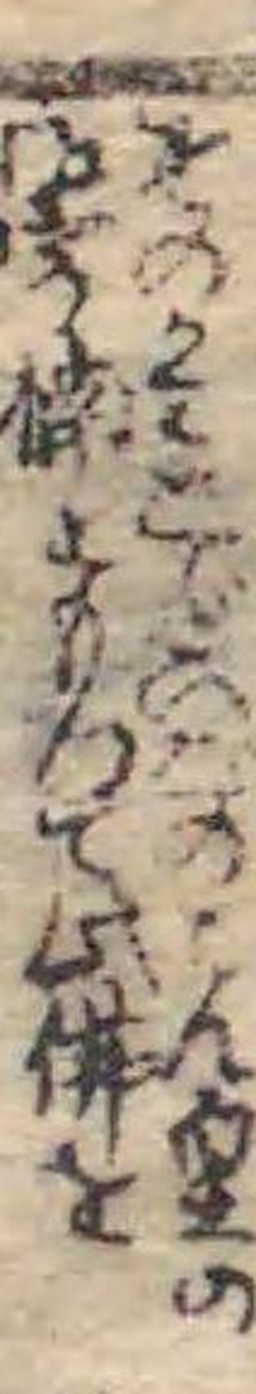御宇楠をもつて此仏を
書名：身体開帳略縁起 : 3巻
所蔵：国立国会図書館 National Diet Library, JAPAN
